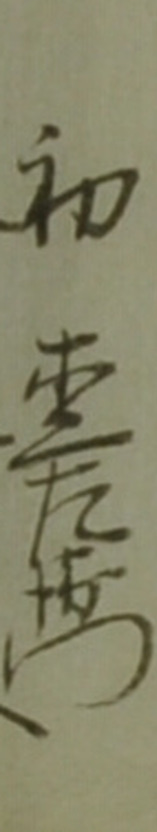初杢左衛門
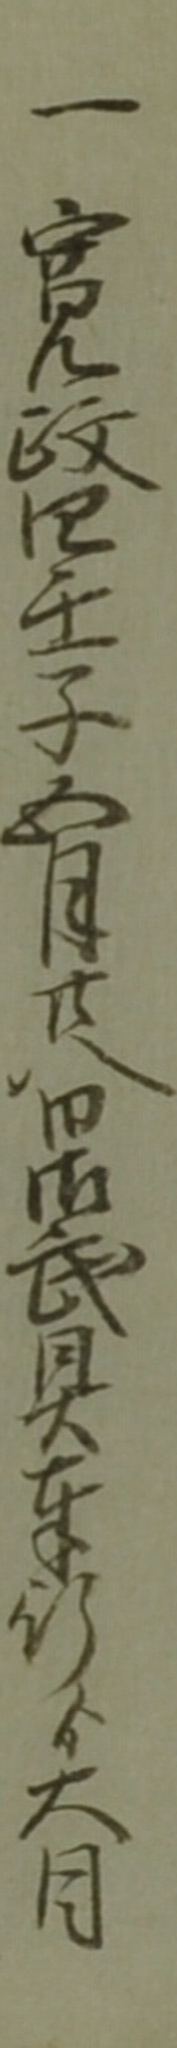一寛政四壬子五月廿八日御武具奉行ゟ大目
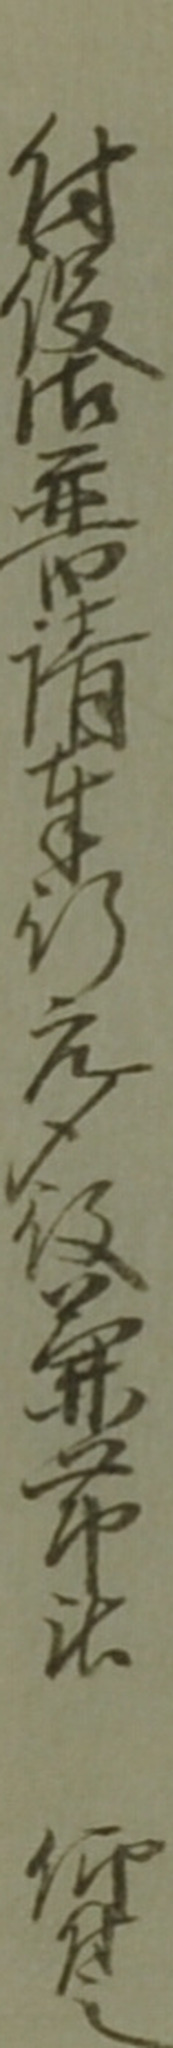付役御普請奉行元〆役兼帯被仰付之
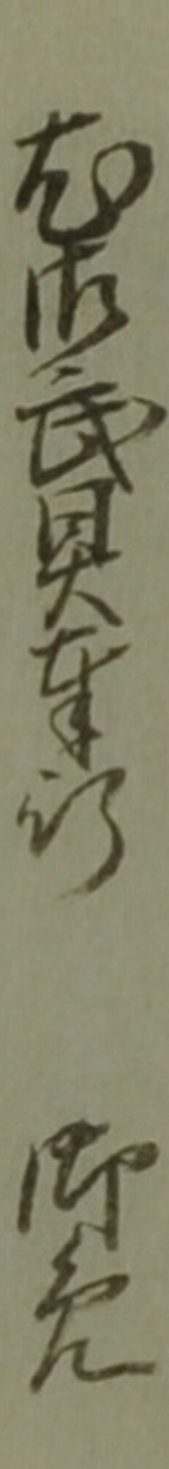尤御武具奉行御免
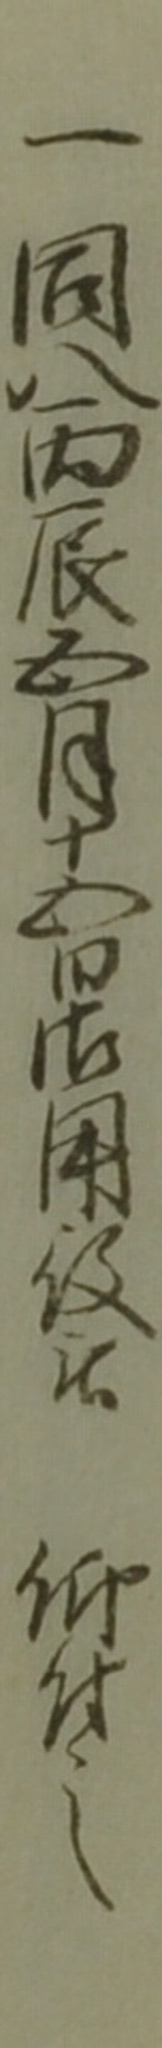一同八丙辰五月十五日御用役被仰付之
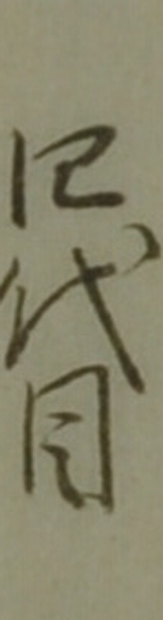四代目
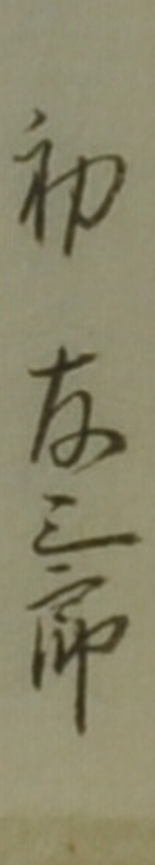初友三郎
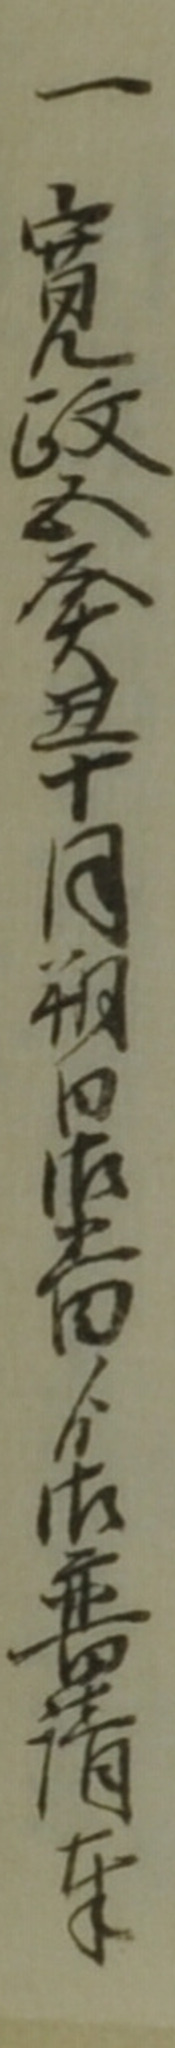一寛政五癸丑十月朔日御番ゟ御普請奉
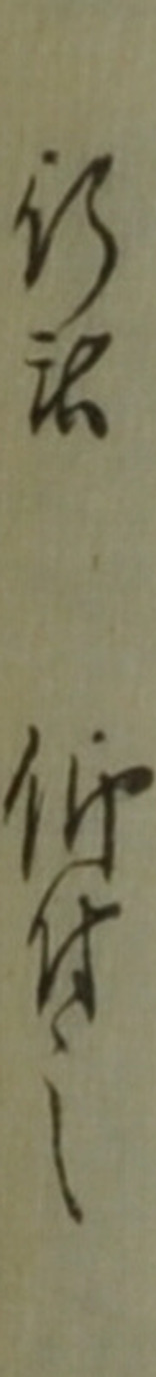行被仰付之
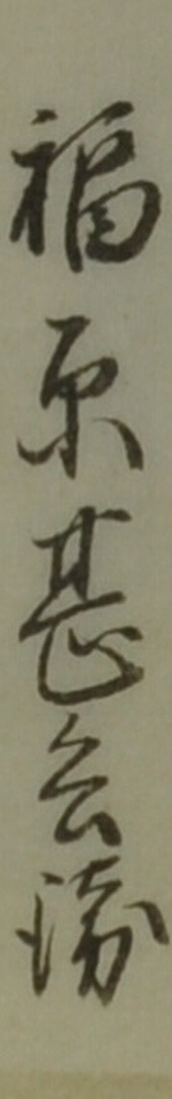福原甚兵衛
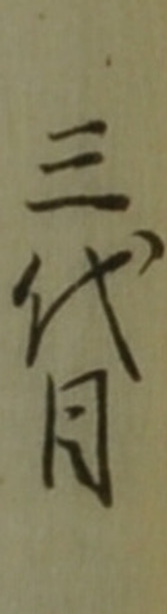三代目
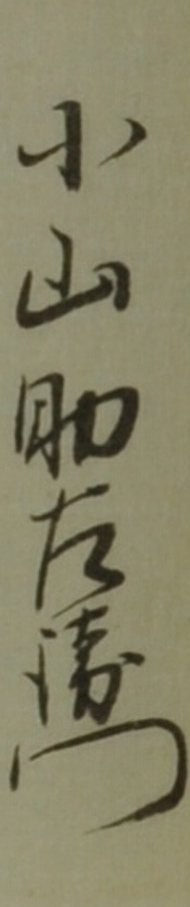小山助左衛門
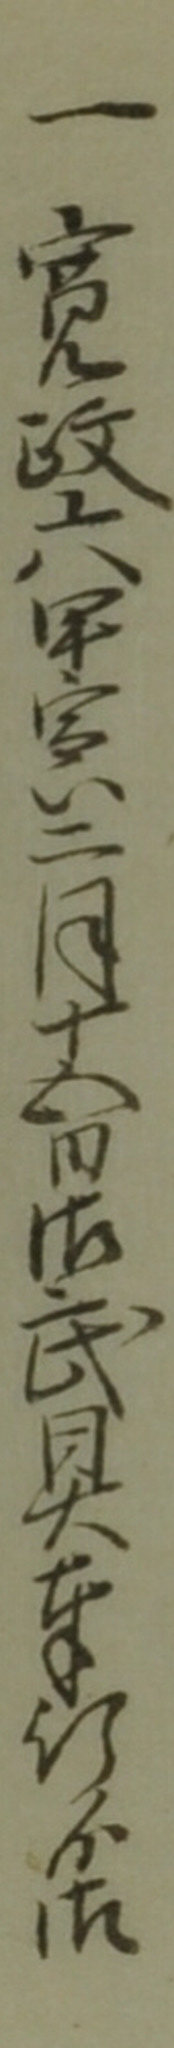一寛政六甲寅二月十五日御武具奉行ゟ御
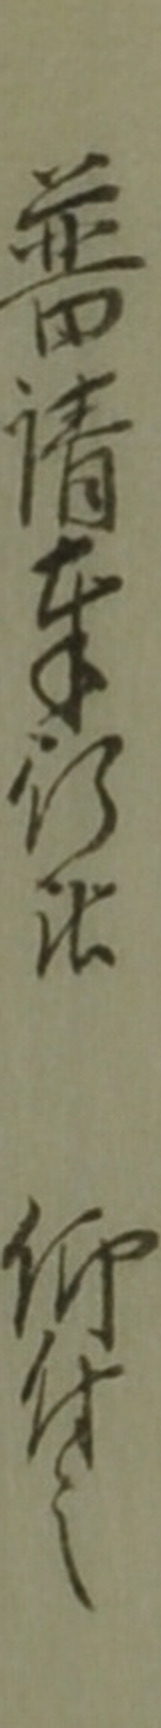普請奉行被仰付之
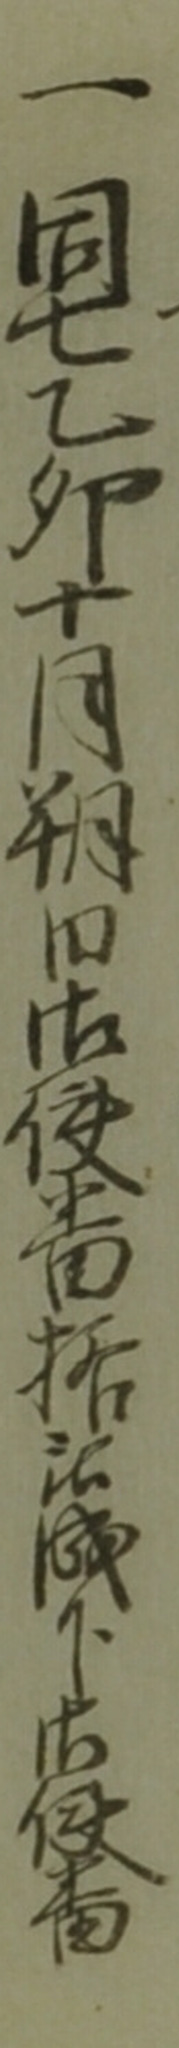一同七乙卯十月朔日御使番格被成下御使番
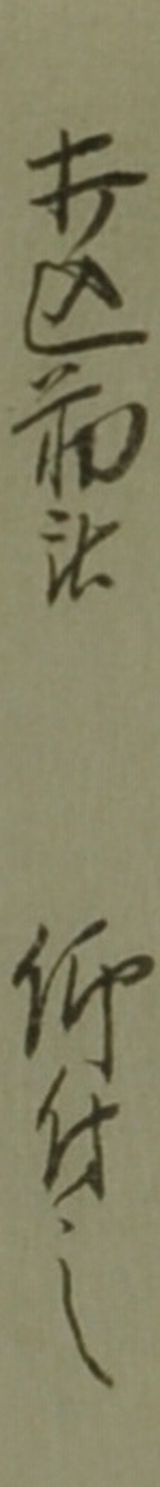打込勤被仰付之
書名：諸御役代々録（六）
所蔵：伊那市立高遠町図書館・合同会社AMANE
